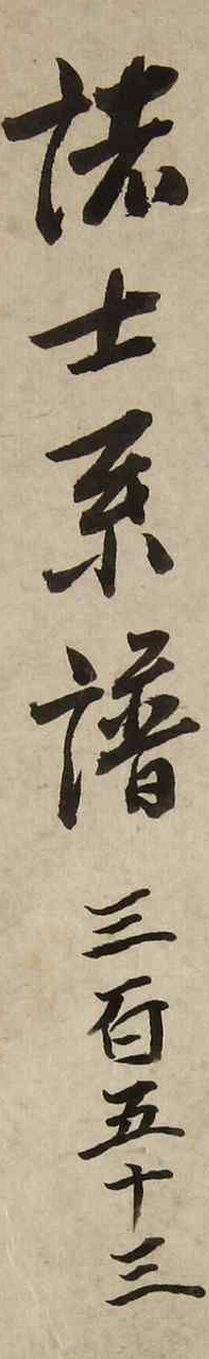諸士系譜三百五十三

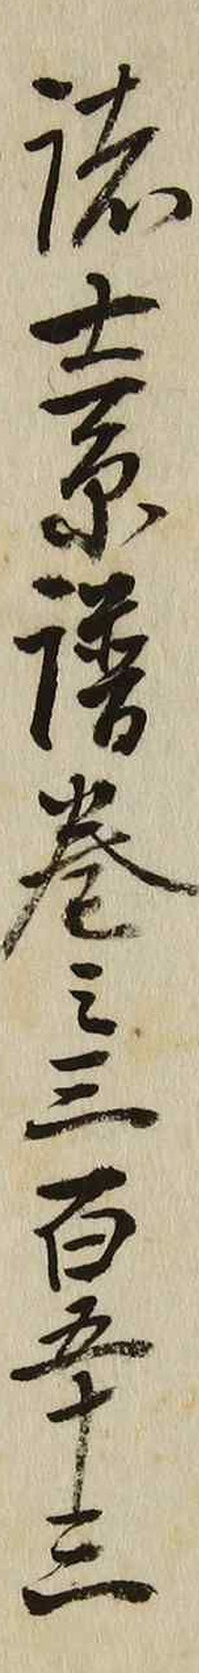諸士系譜巻之三百五十三
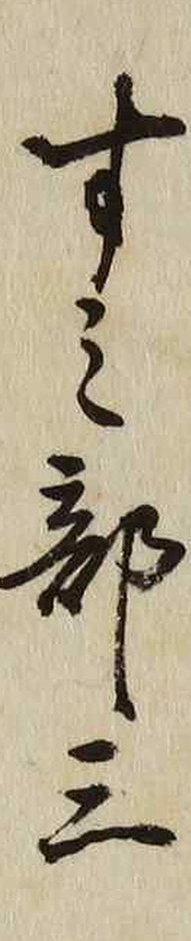す之部三
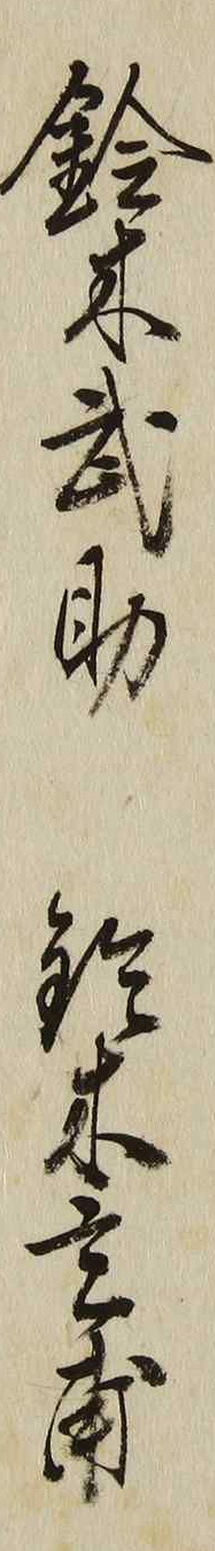鈴木武助鈴木玄甫
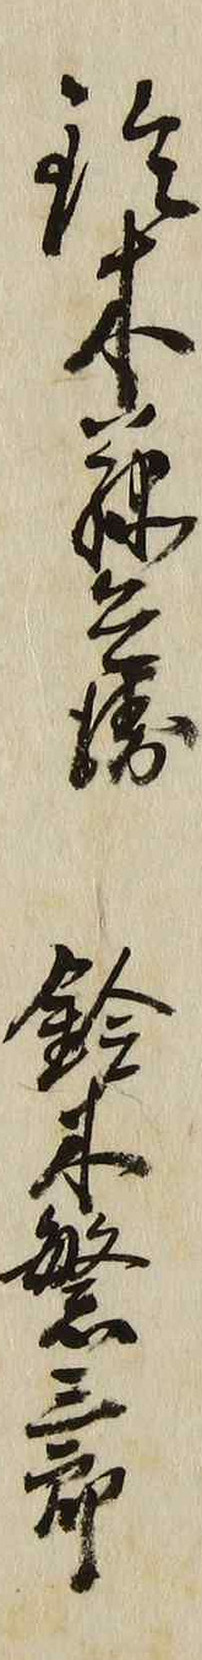鈴木藤兵衛鈴木繁三郎

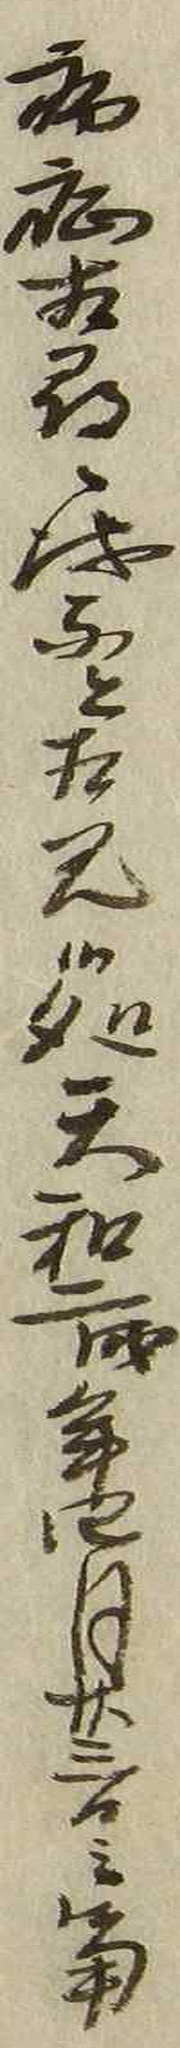病症相尋候儀なと相見候処天和二戌年四月廿三日之御用
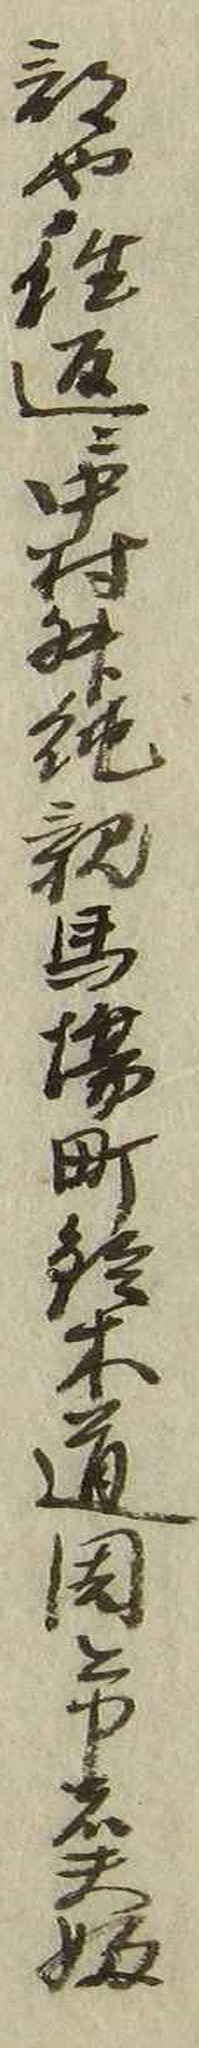部や往返ニ中村舛純親馬場町鈴木道園と申者夫婦
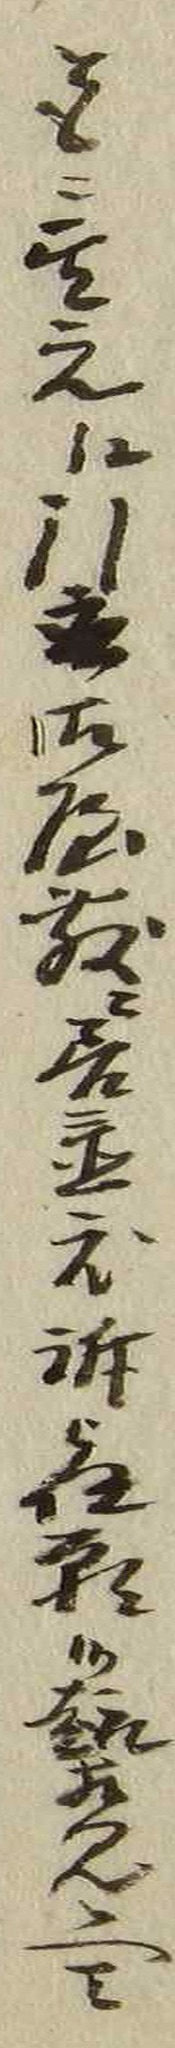ともニ其元江引取御屋敷ニ居置度訴被任願候趣相見候へは
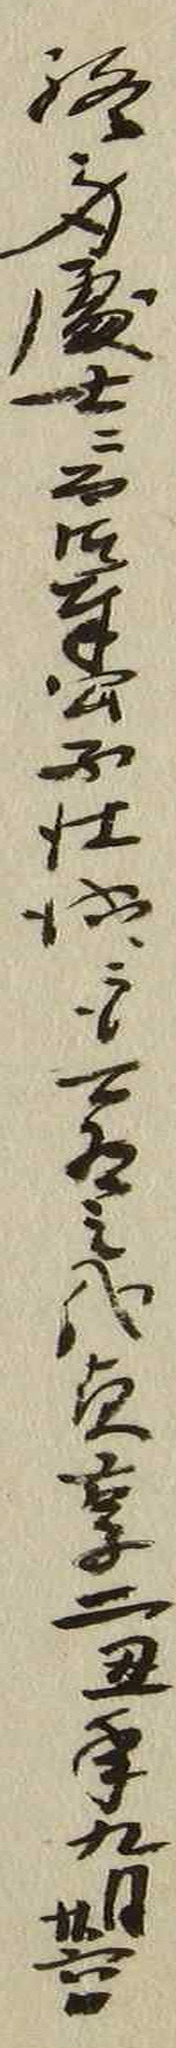終身處士ニ而御奉公不仕儀ニも可有之哉貞享二丑年九月廿六日
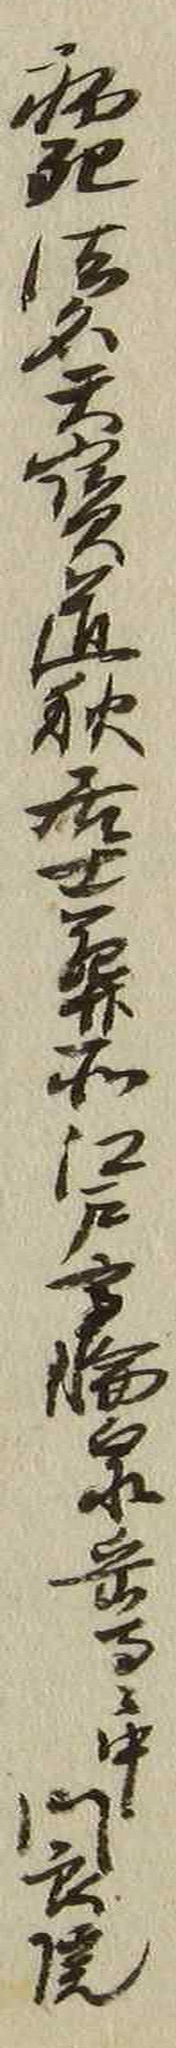病死法名天宝道秋居士葬所江戸高輪泉岳寺之中門良院
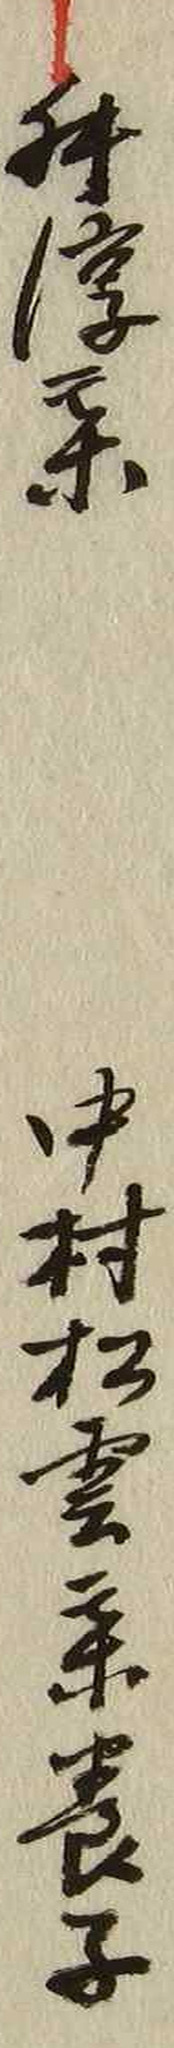舛淳某中村松雲某養子
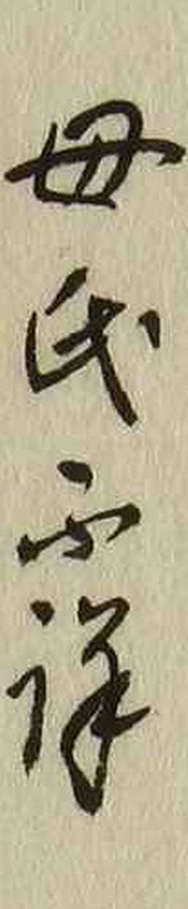母氏不詳
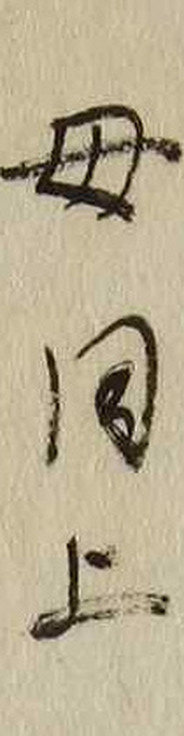母同上
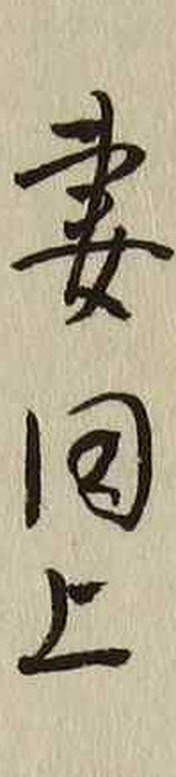妻同上
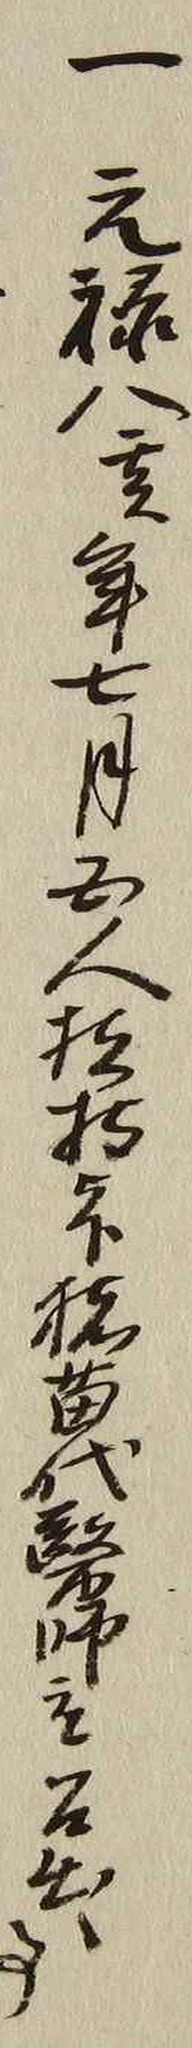一元禄八亥年七月五人扶持被下猪苗代医師被召出候事
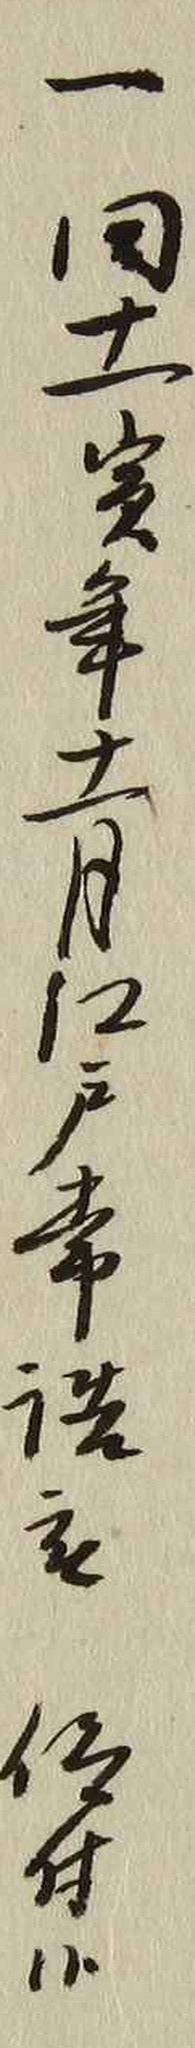一同十一寅年十一月江戸常詰被仰付候
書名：諸士系譜　巻之353　す之部3
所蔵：会津若松市立会津図書館
